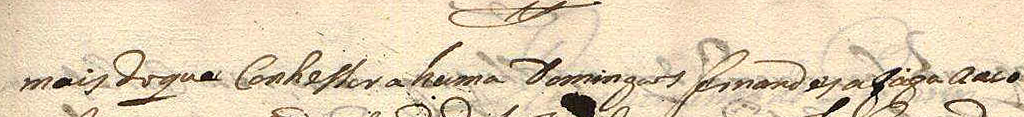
mais do que Conhesser a huma Domingas fernandes a Gaga auo
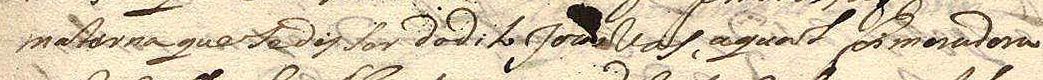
materna que se dis ser do dito Joaõ Vas, a qual foi moradora
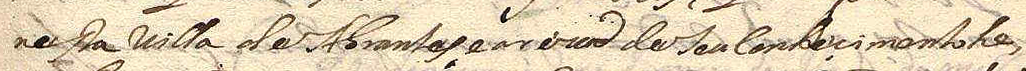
nesta villa de Abrantes, e a rezaõ de seu conhecimento he,
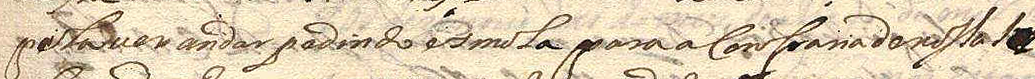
pela uer andar pedindo esmola para a Confraria de nossa se
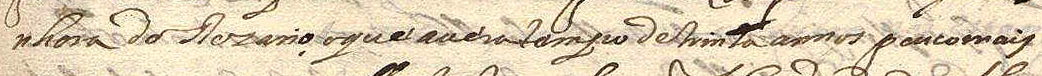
nhora do Rozario, o que auera tempo de trinta annos pouco mais
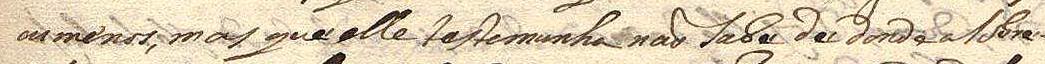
ou menos, mas que elle testemunha naõ sabe de donde a sobre
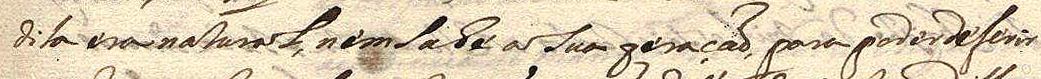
dita era natural, nem sabe a sua geração, para poder deferir
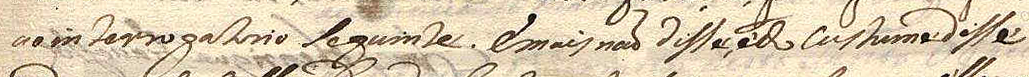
ao interrogatorio seguinte. E mais naõ disse, e do custume disse
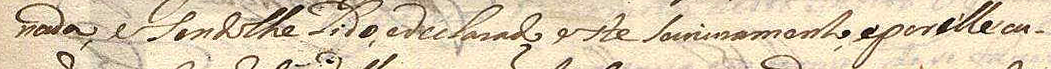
nada, e sendolhe Lido, e declarado este seu iuramento, e por elle ou
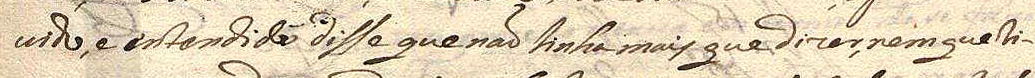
uido, e entendido disse que naõ tinha mais que dizer, nem que ti
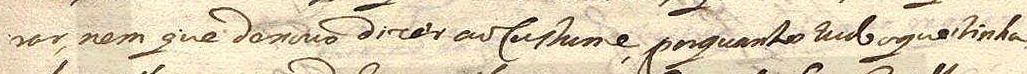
rar, nem que de nouo dizer ao Custume, porquanto tudo o que tinha
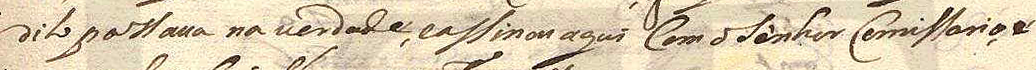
dito passaua na uerdade, e assinou aqui Com o Senhor Comissario, e
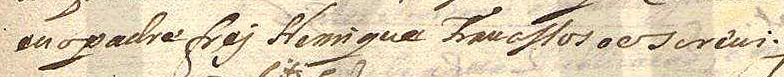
eu o padre frej Henrique Trauassos o escreui.
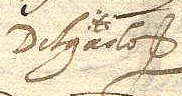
Delgado
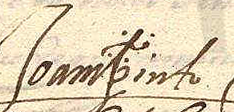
Joam pinto
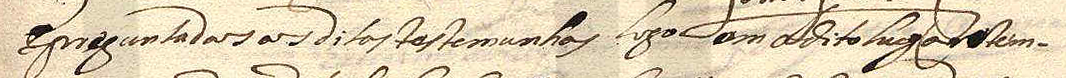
E preguntadas as ditas testemunhas logo em o dito lugar e tem
